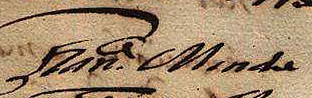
Fran.co Mendo
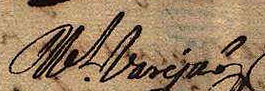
Mel. Varejaõ
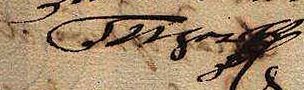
Trigozo
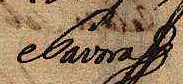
e Tavora
